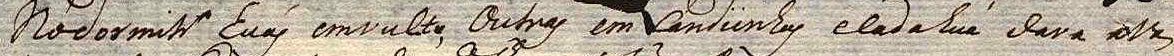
No dormitro huās em vulto, Outras em Candiinhas e cada huā dava a Va
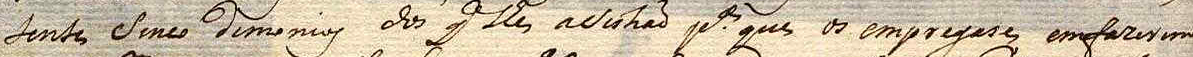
tente sinco demonios dos q̄ lhes asistiaõ p.a que os empregase em fazerem
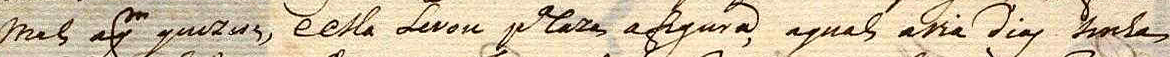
mal a qm quizese, e ella Levou pa Caza a figura, a qual avia dias tinha
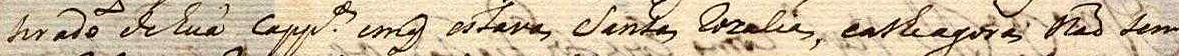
tirado de huā Capp.a em q̄ estava santa Rozalia, e athe agora naõ tem
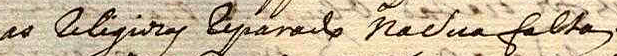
as Religiozas Reparado na sua falta.
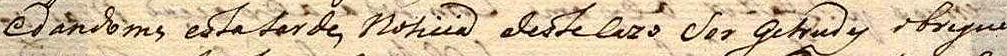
e dandome esta tarde noticia deste cazo sor Getrudes obriguei
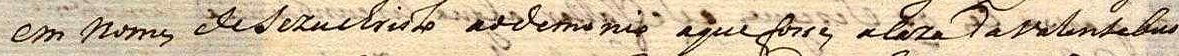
em nome, de Iezu christo ao demonio a que fosse a caza da valenta bus
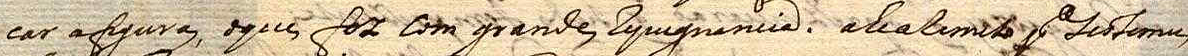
car a figura, o que fez com grande Repugnancia. ahi a Remeto pa testemu
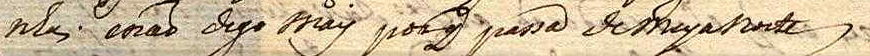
nha. e naõ digo mais porq̄ passa de meya noite
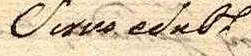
Servo e Sub.o
